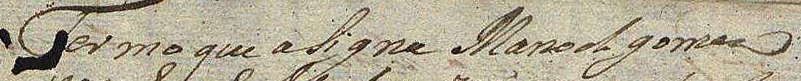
Termo que asigna Manoel gomes
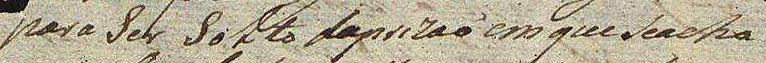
para ser solto da prizaõ em que se acha
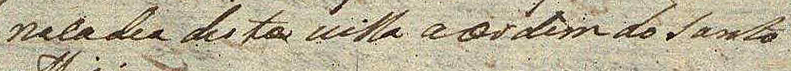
na cadea desta uilla a ordem do santo
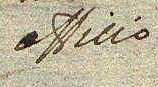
officio
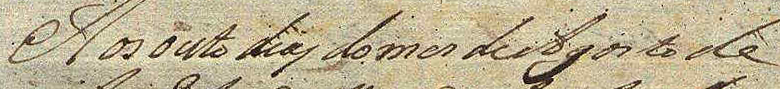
Aos outo dias do mes de Agosto de
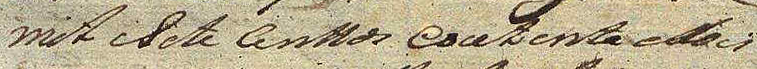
mil e setecenttos e outenta e dois
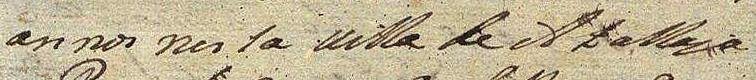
annos nesta uilla de Atallaja
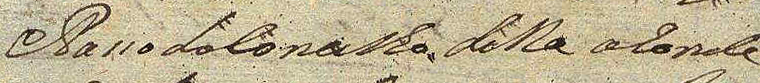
Passo do Concelho della ahonde
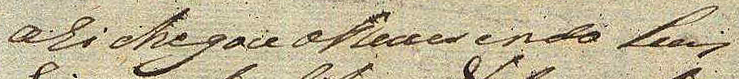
ahi chegou o Reuerendo Luiz
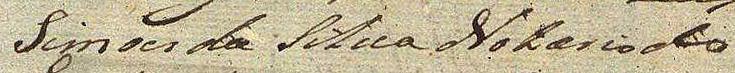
Simoes da Silua Notario do
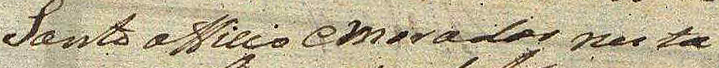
Santo officio e morador nesta
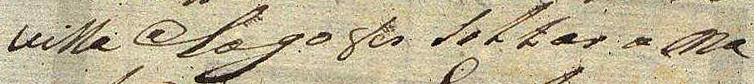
uilla e logo fes soltar a Ma
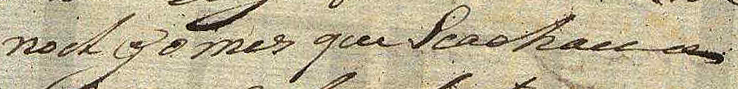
noel Gomes que se achou
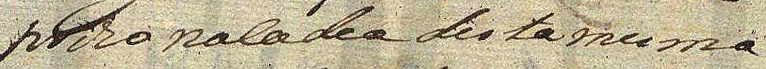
prezo na cadea desta mesma
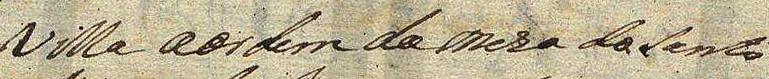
villa a ordem da meza do Santo
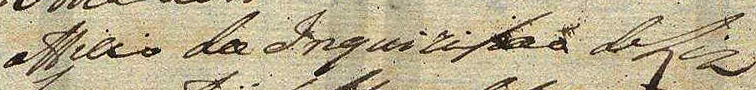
officio da Inquizissaõ de Lis
